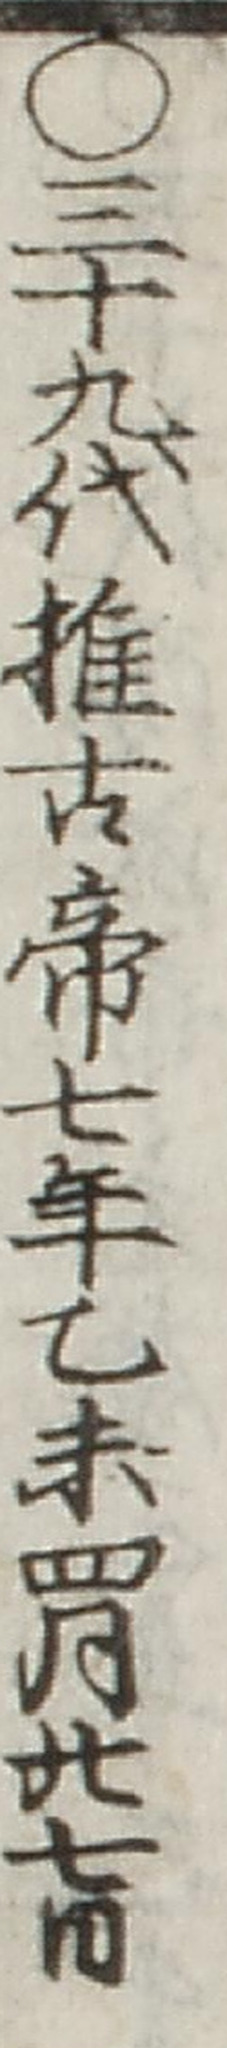○三十九代推古帝七年乙未四月廿七日叡
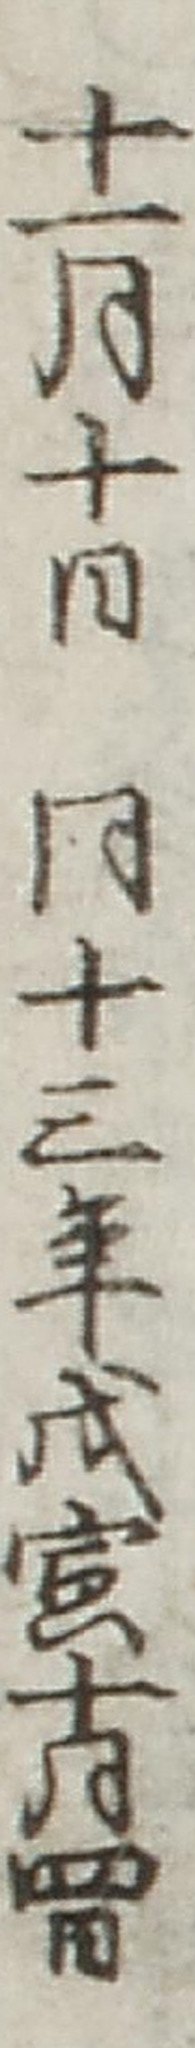十一月十日同十三年戌寅十月四日湖水

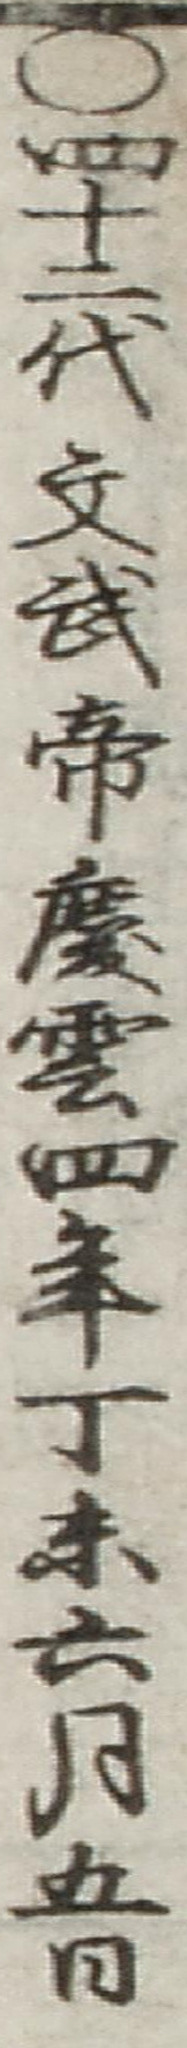○四十二代文武帝慶雲四年丁未六月五日
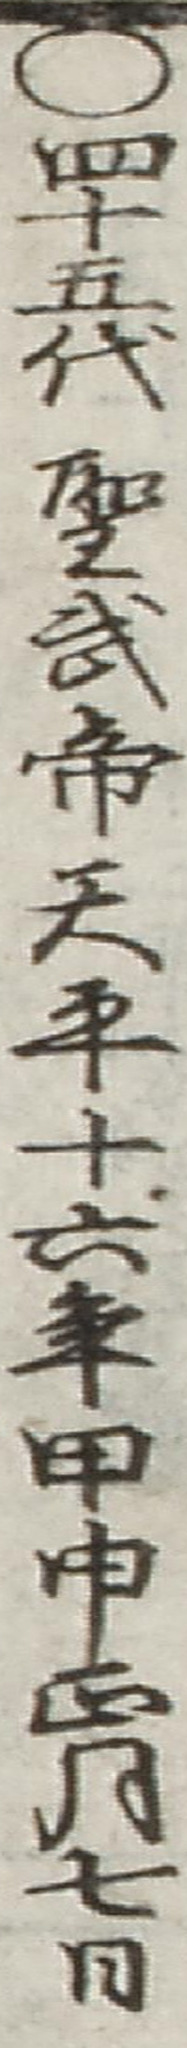○四十五代聖武帝天平十六年甲申正月七日
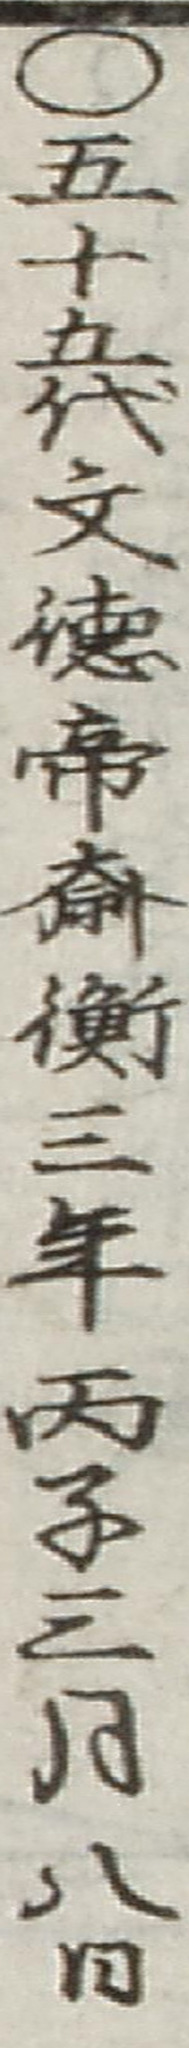○五十五代文徳帝斎衡三年丙子三月八日
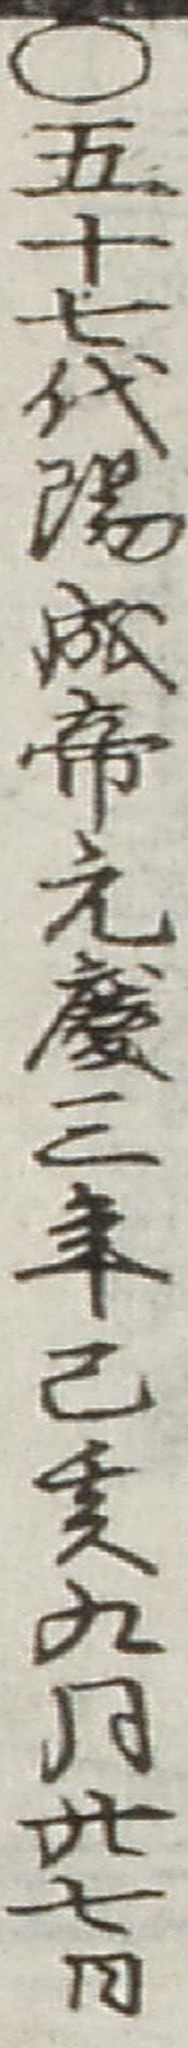○五十七代陽成帝元慶三年己亥九月廿七日竹生嶋
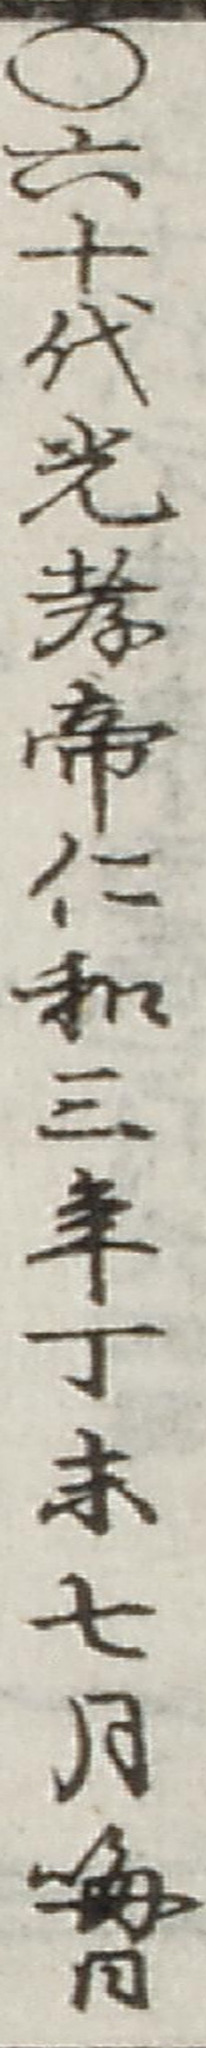○六十代光孝帝仁和三年丁未七月晦日
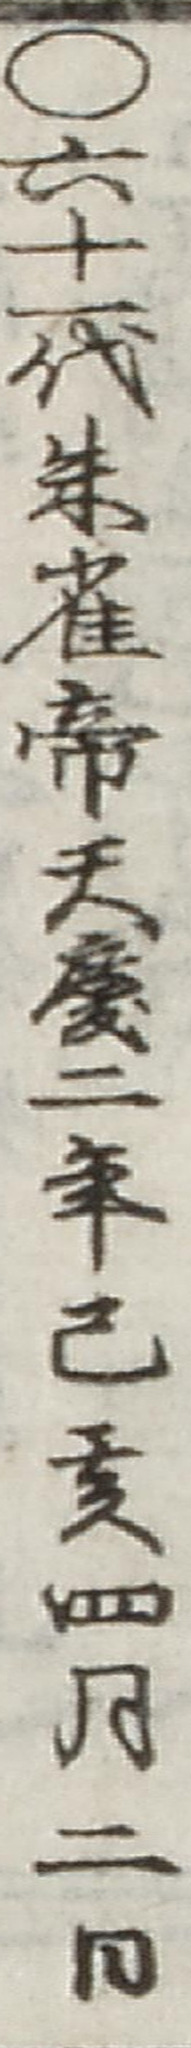○六十一代朱雀帝天慶二年己亥四月二日
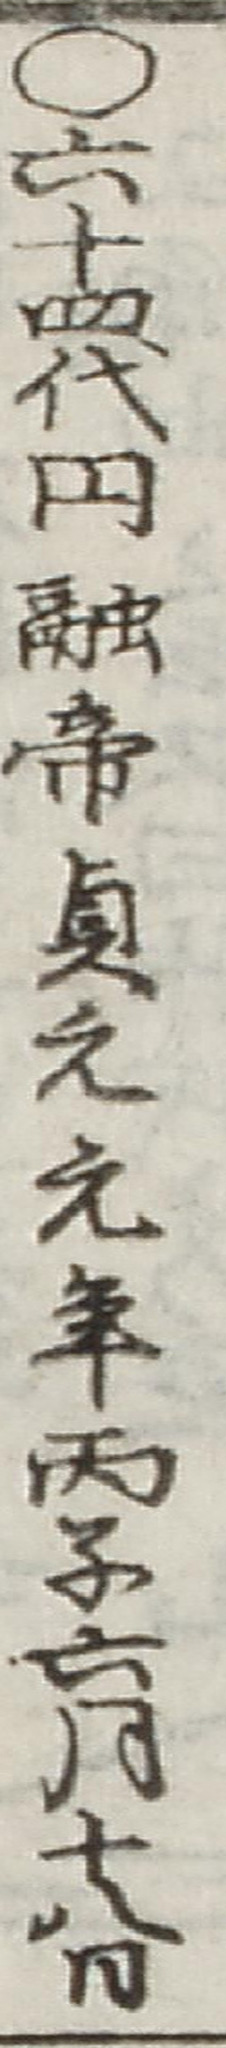○六十四代円融帝貞元元年丙子六月十八日
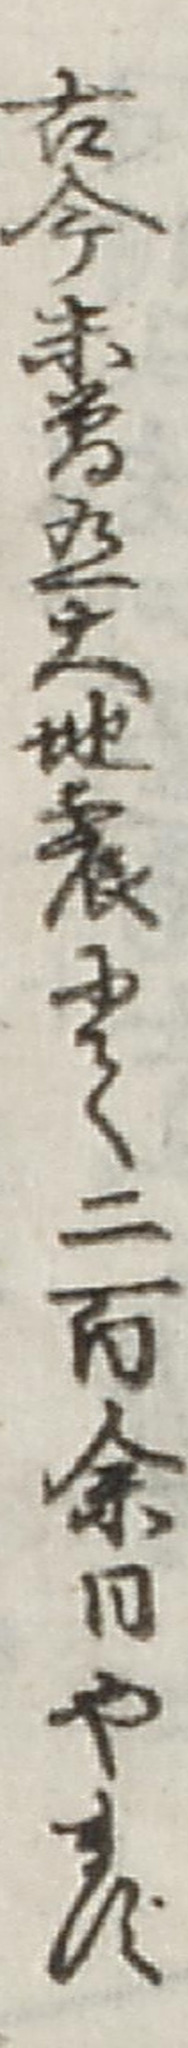古今未曽有大地震にて二百余日やまず
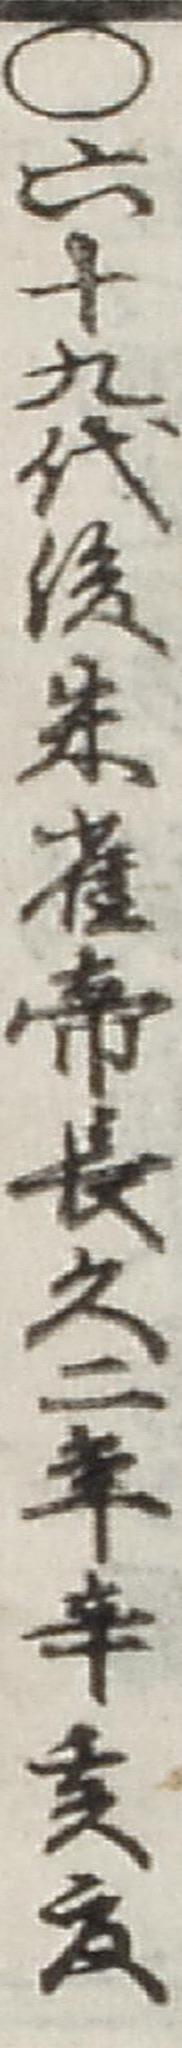○六十九代後朱雀帝長久二年辛亥夏
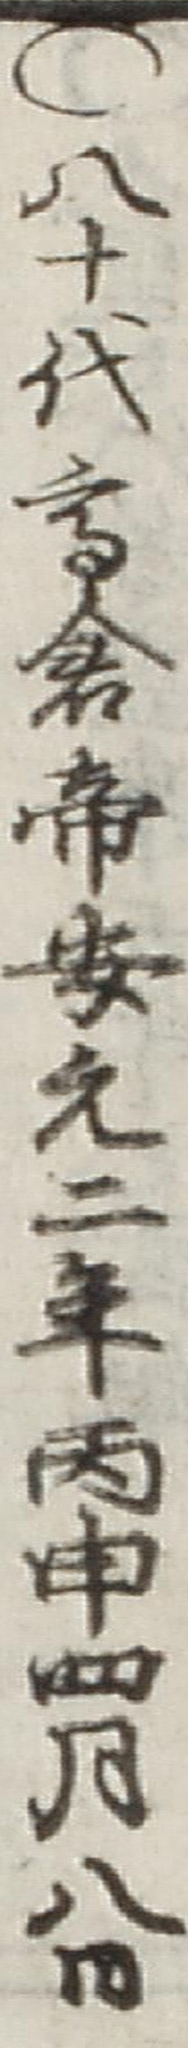○八十代髙倉帝安元二年丙申四月八日
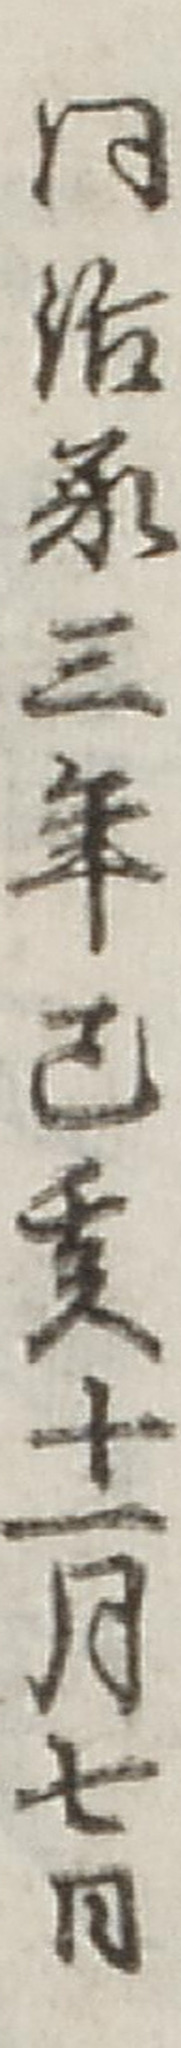同治承三年己亥十一月七日
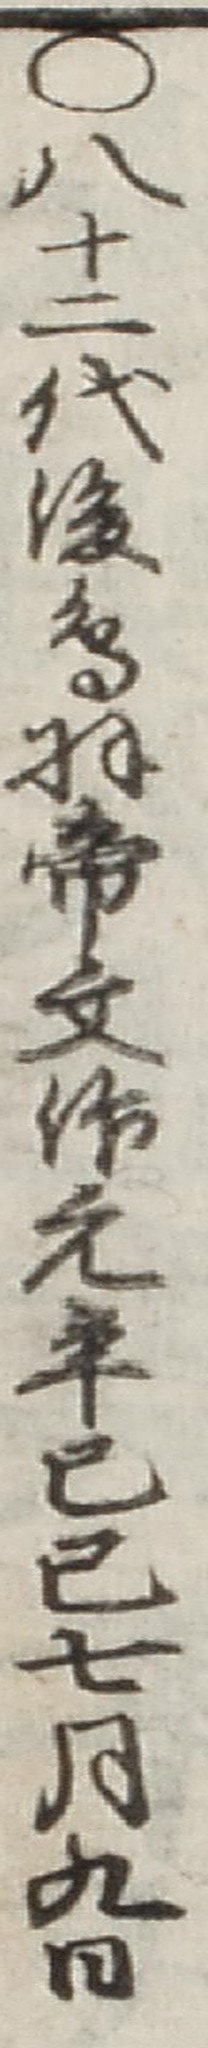○八十二代後鳥羽帝文治元年已已七月九日
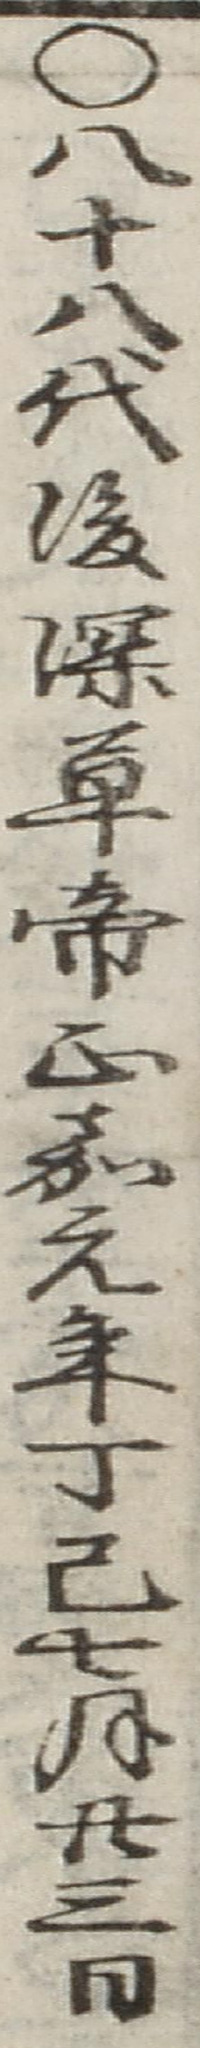○八十八代後深草帝正嘉元年丁己七月廿三日
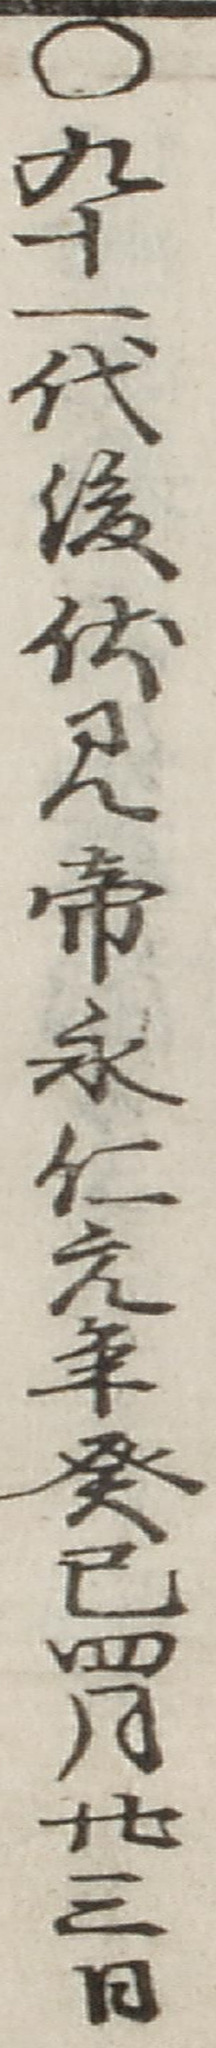○九十一代後伏見帝永仁元年癸已四月廿三日
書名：地震世直草紙　全
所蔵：東京大学地震研究所図書室 Earthquake Research Institute Library, The University of Tokyo, JAPAN
